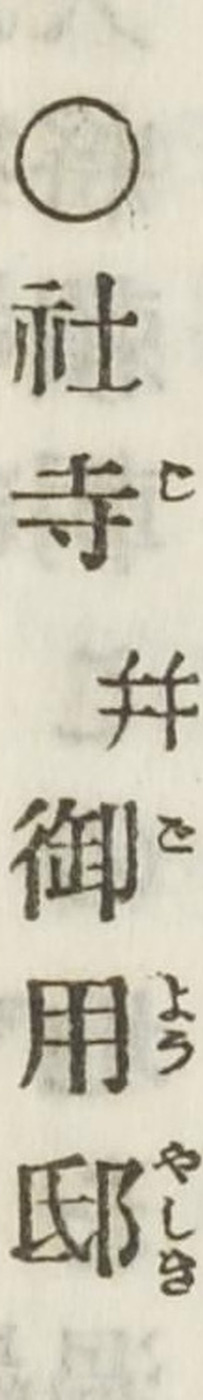○社寺并御用邸
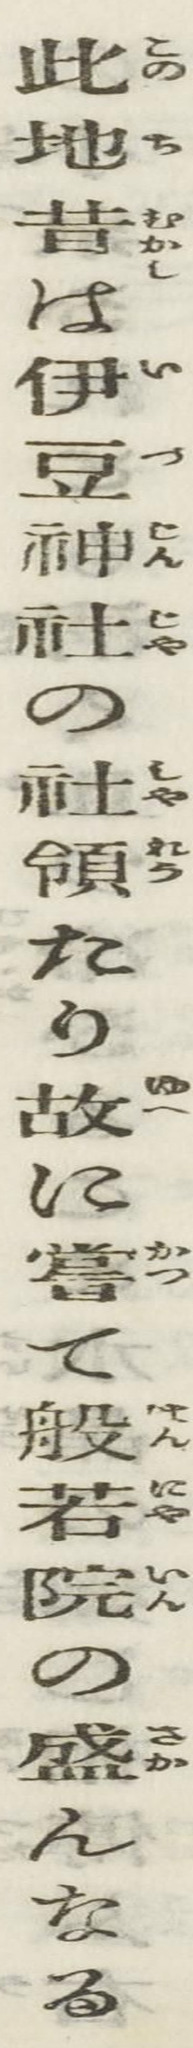此地昔は伊豆神社の社領たり故に嘗て般若院の盛んなる
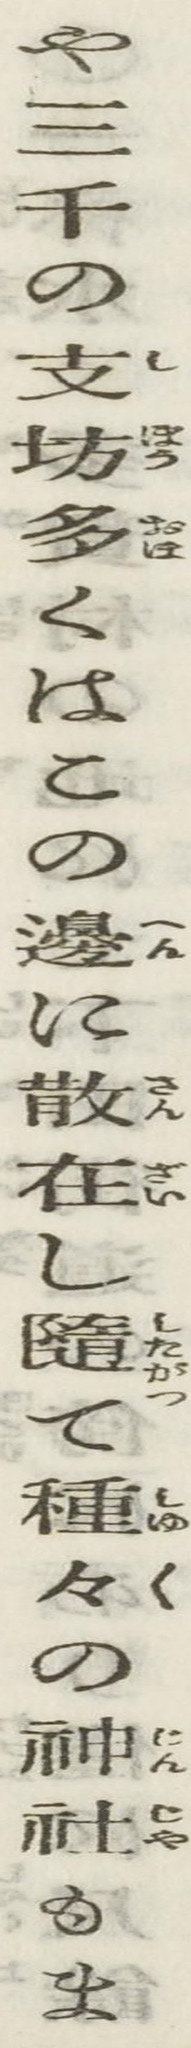や三千の支坊多くはこの邊に散在し随て種々の神社もま
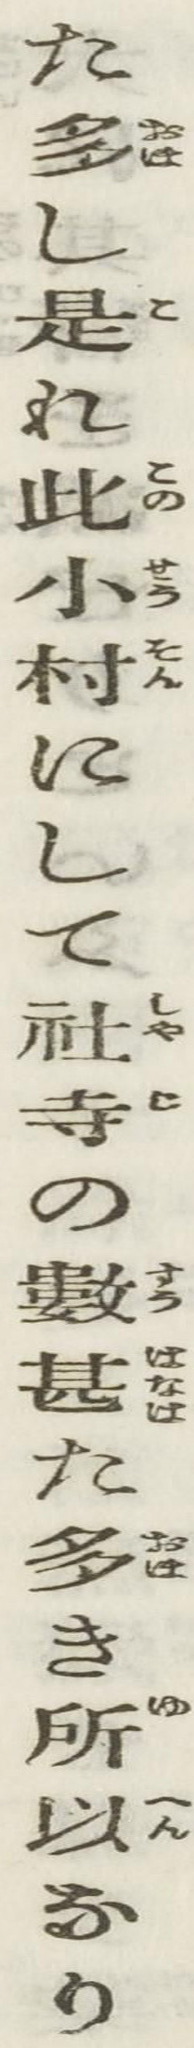た多し是れ此小村にして社寺の数甚だ多き所以なり
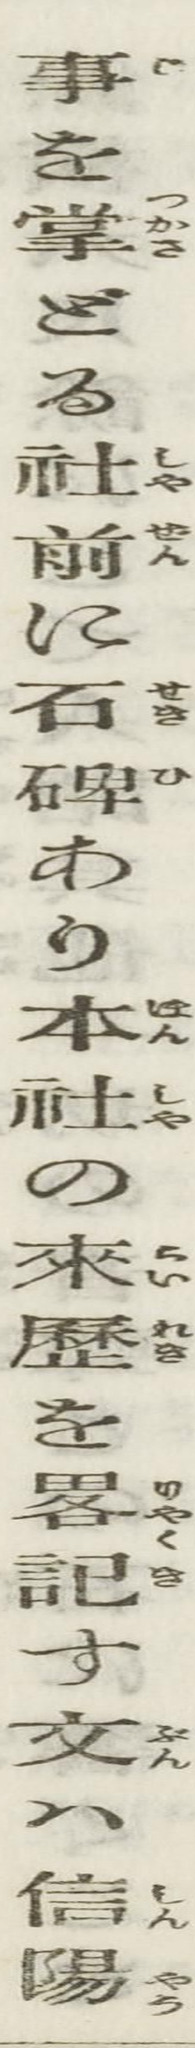事を掌どる社前に石碑あり本社の来歴を略記す文は信陽
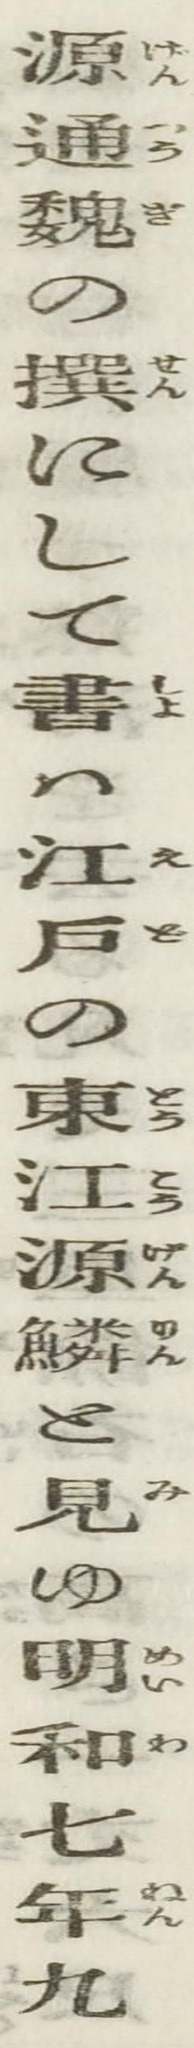源通魏の撰にして書は江戸の東江源鱗と見ゆ明和七年九
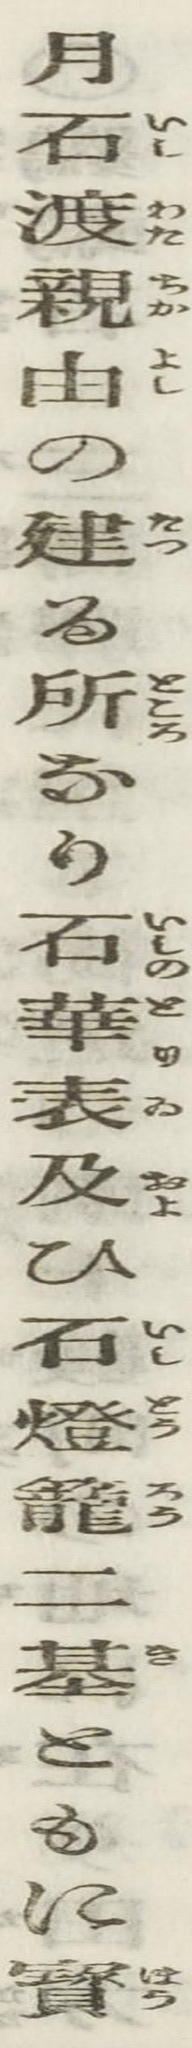月石渡親由の建る所なり石華表及び石燈籠二基ともに宝
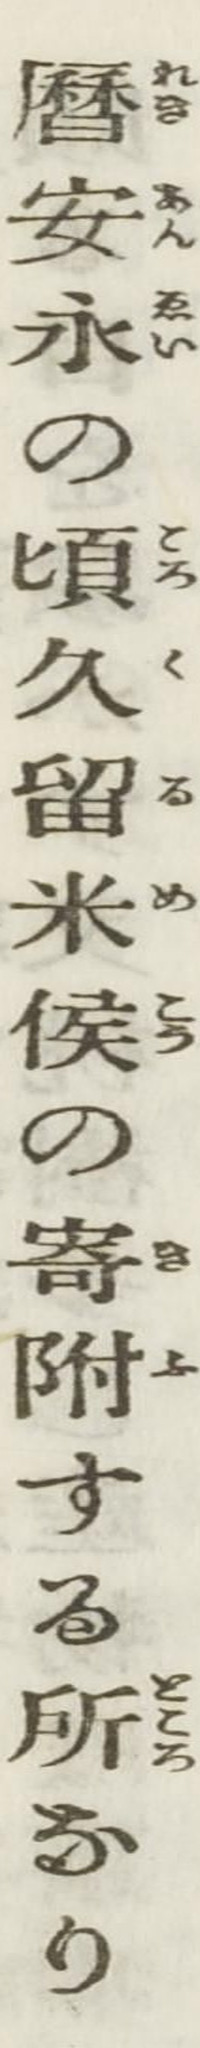暦安永の頃久留米侯の寄附する所なり
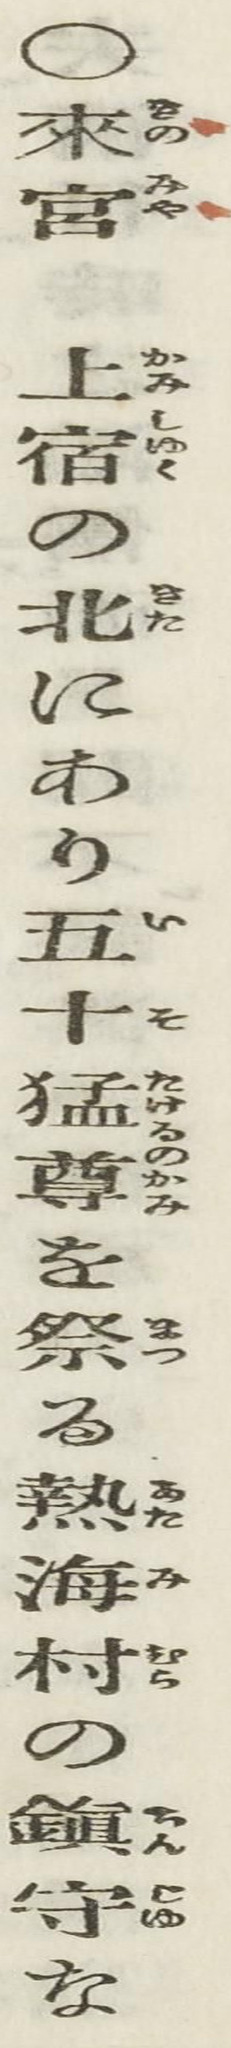○来宮上宿の北にあり五十猛尊を祭る熱海村の鎮守な
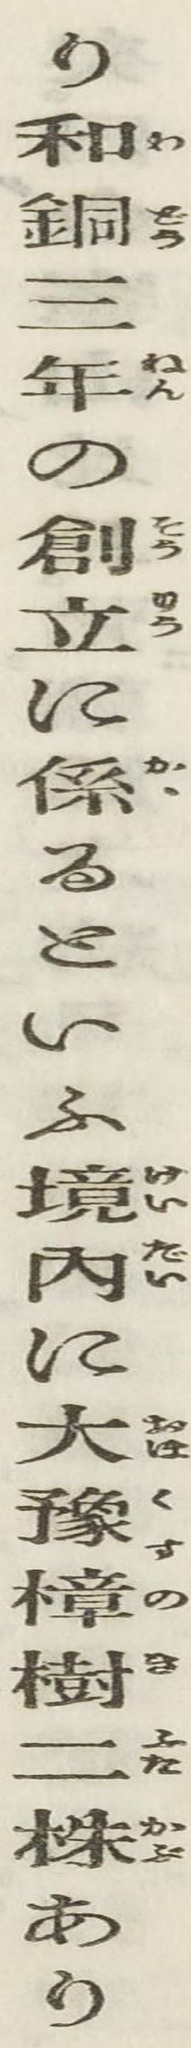り和銅三年の創立に係るといふ境内に大豫樟樹二株あり
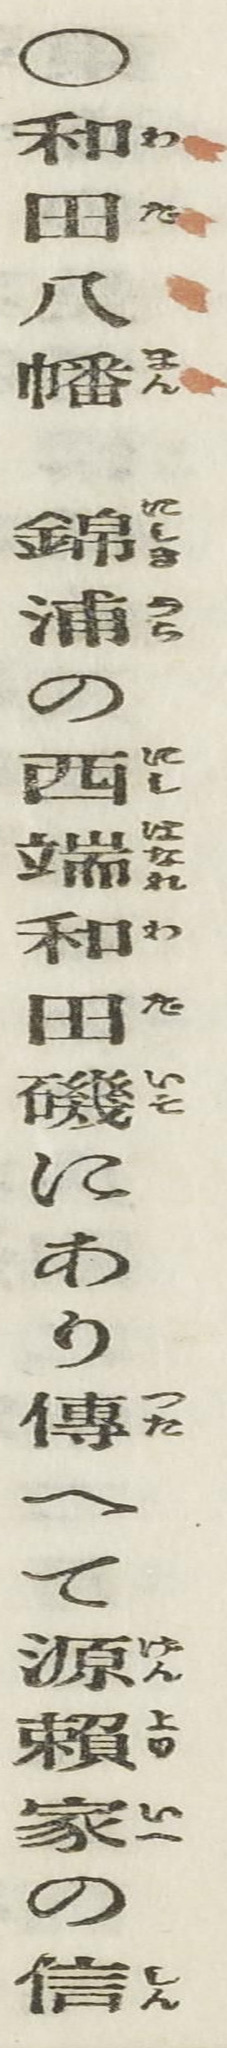○和田八幡錦浦の西端和田磯にあり伝へて源頼家の信
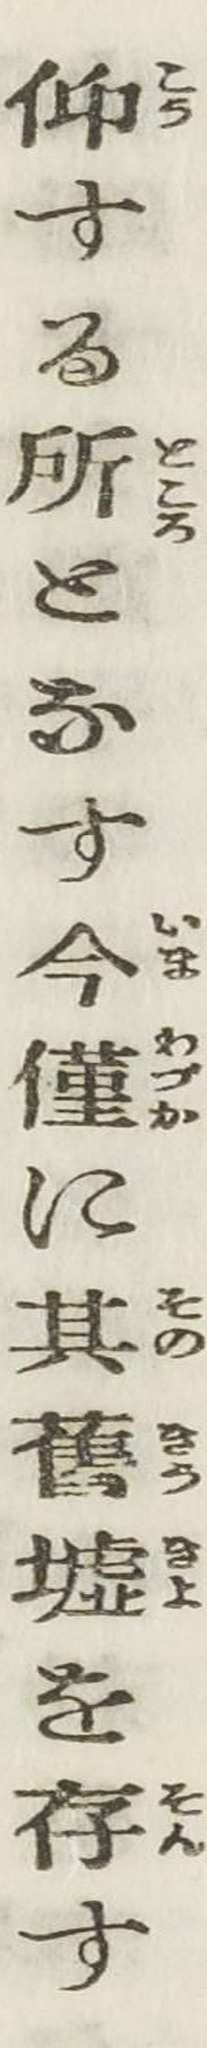仰する所となす今僅に其旧墟を存す
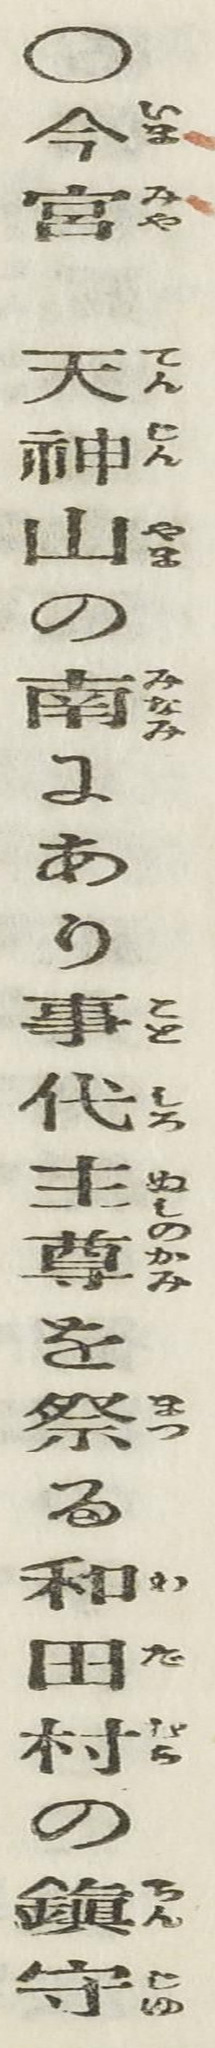○今宮天神山の南にあり事代主尊を祭る和田村の鎮守
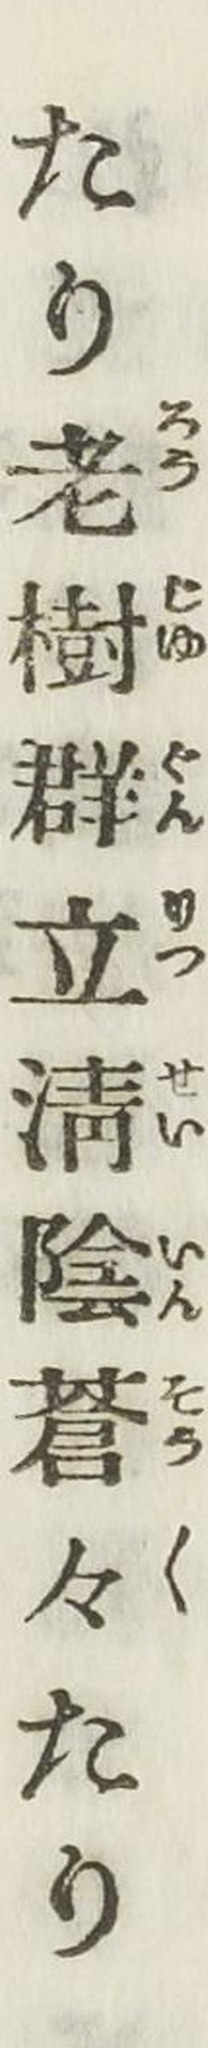たり老樹群立清陰蒼々たり
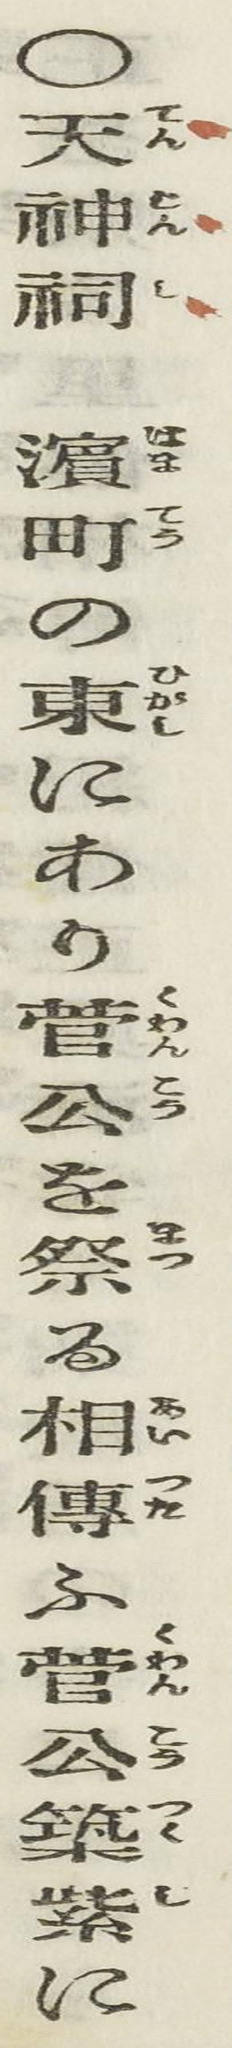○天神祠浜町の東にあり菅公を祭る相伝ふ菅公筑紫に
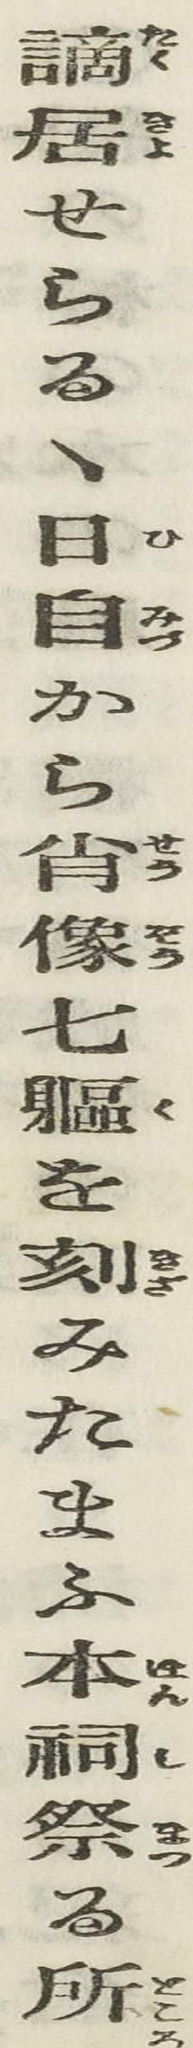謫居せらるゝ日自から肖像七躯を刻みたまふ本祠祭る所
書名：熱海獨案内　全
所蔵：東京大学地震研究所図書室 Earthquake Research Institute Library, The University of Tokyo, JAPAN
